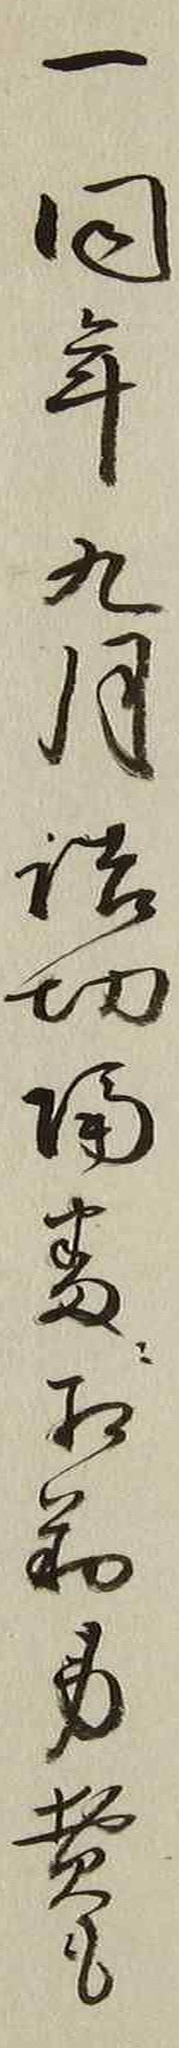一同年九月詰切隔番ニ相勤身費も
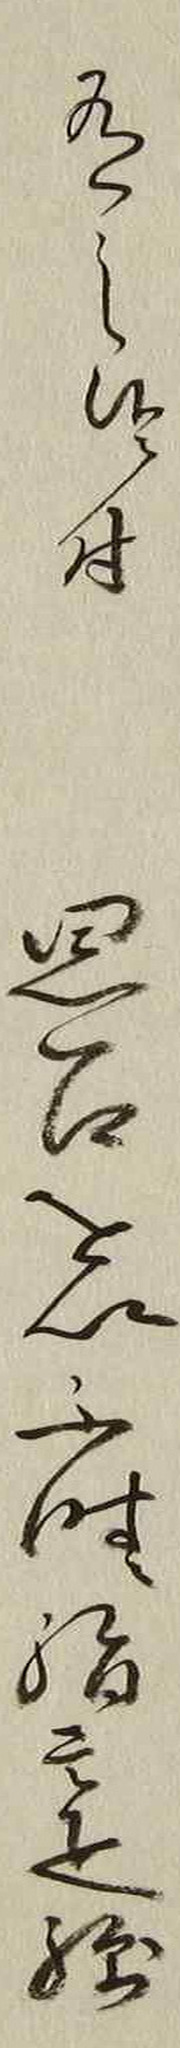有之候ニ付思召を以不時ニ絹壱疋綿
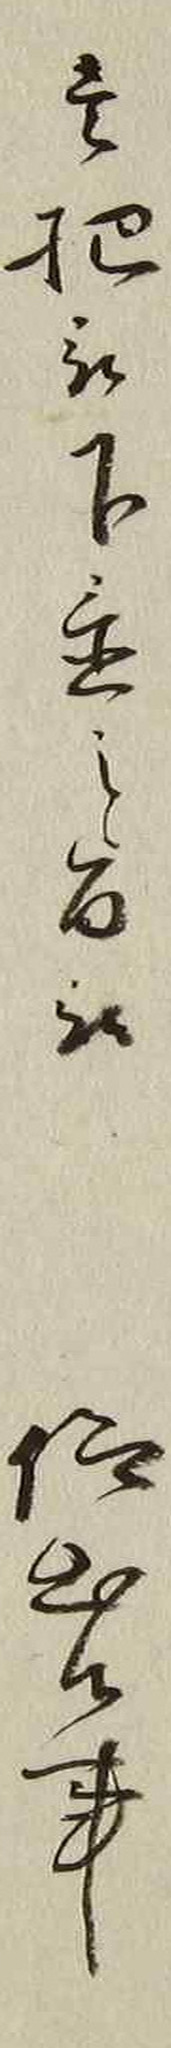壱把被下置候間被仰出候事
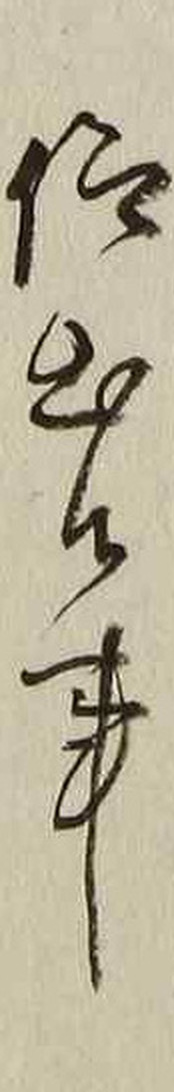仰出候事
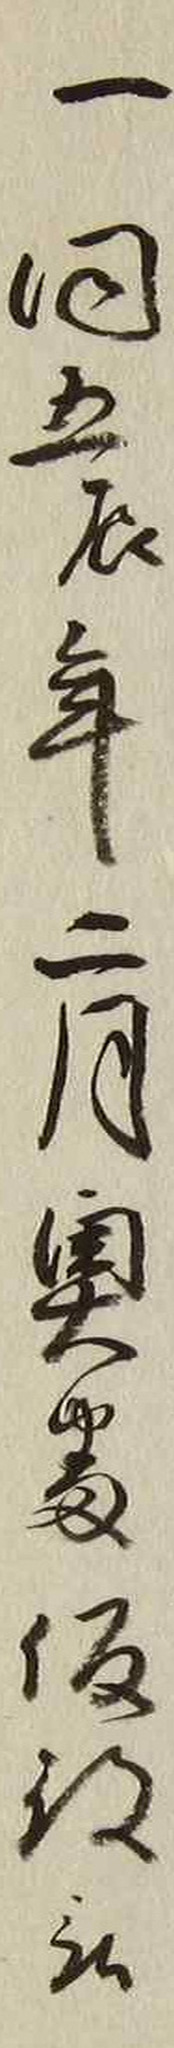一同五辰年二月奥番仮役被
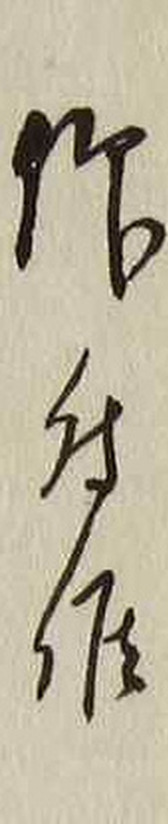仰付候
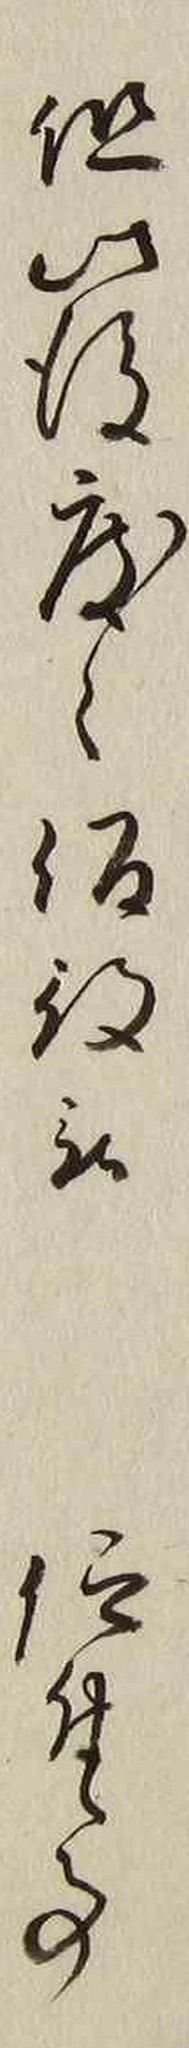但此後度々仮役被仰付候事
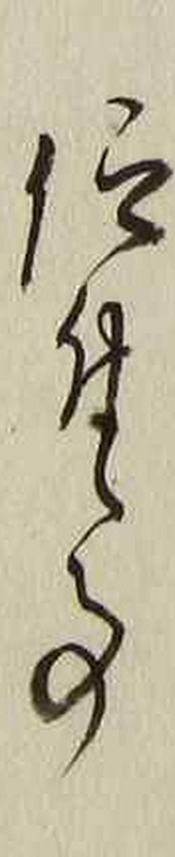仰出候事
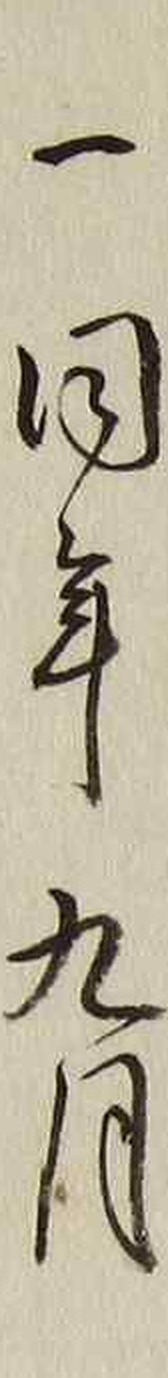一同年九月
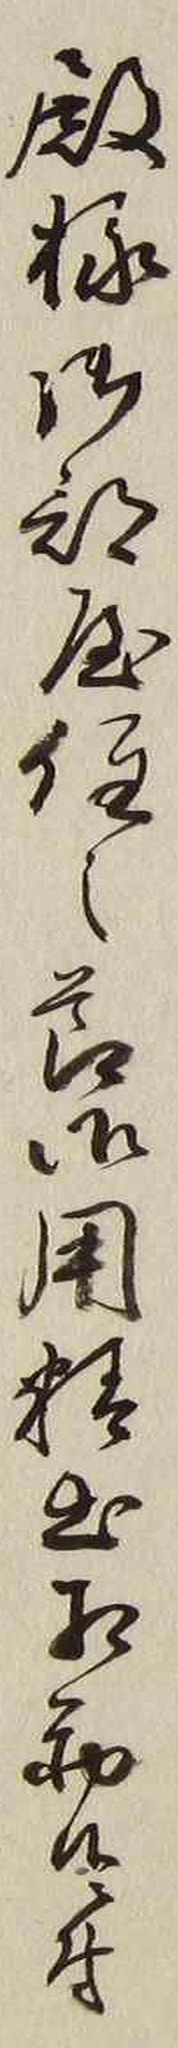殿様御部屋住之節御用精出相勤候ニ付
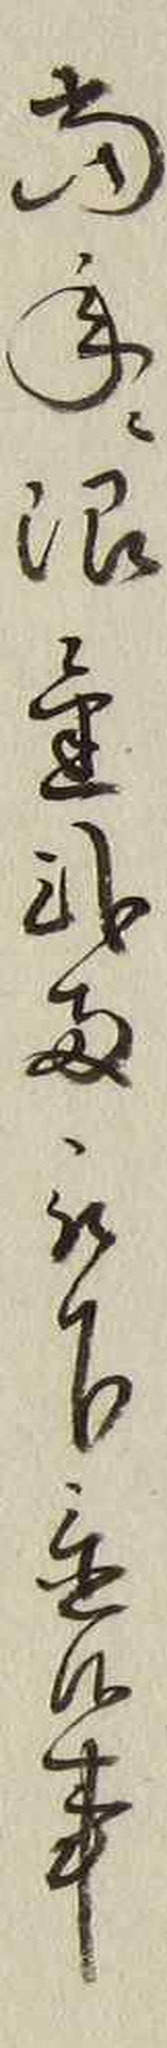当年ニ限金弐両被下置候事
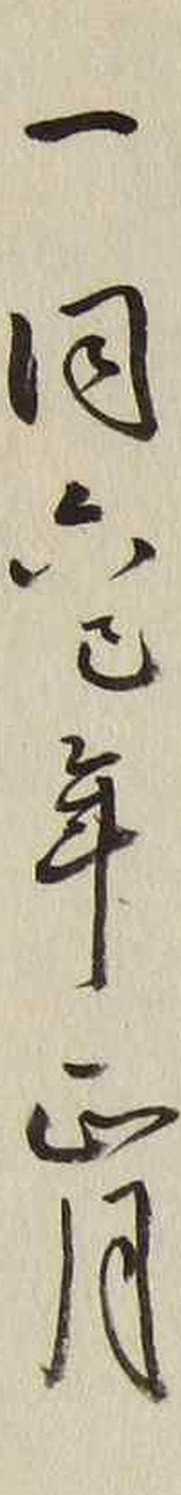一同六巳年正月

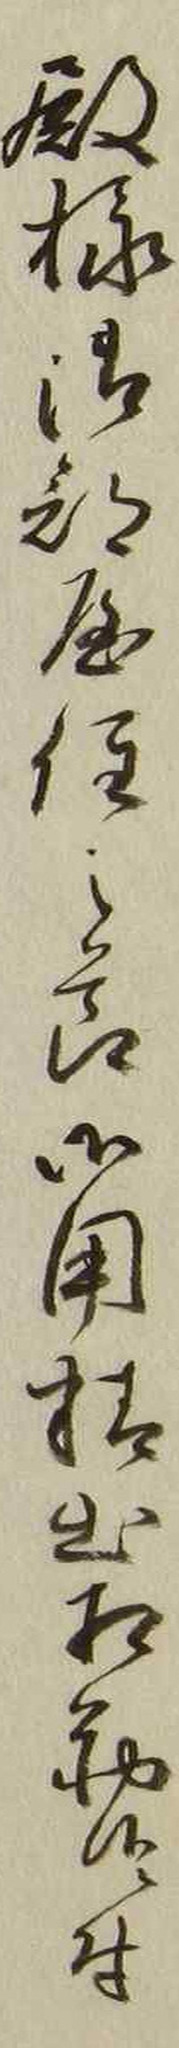殿様御部屋住之節御用精出相勤候ニ付
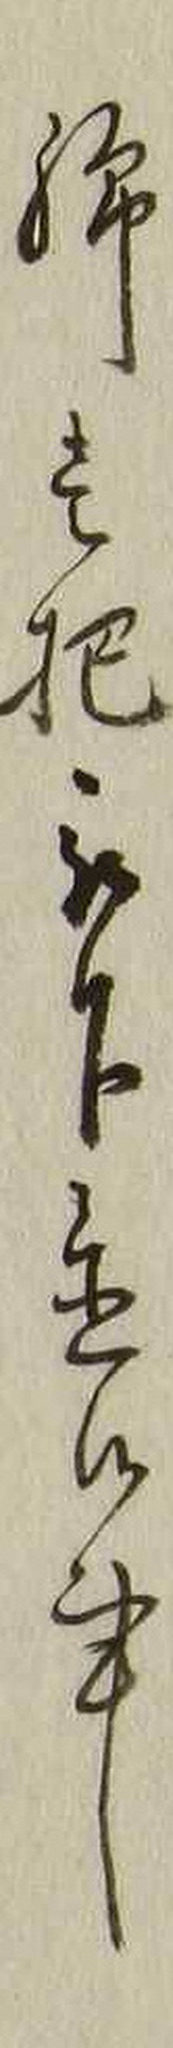綿壱把被下置候事
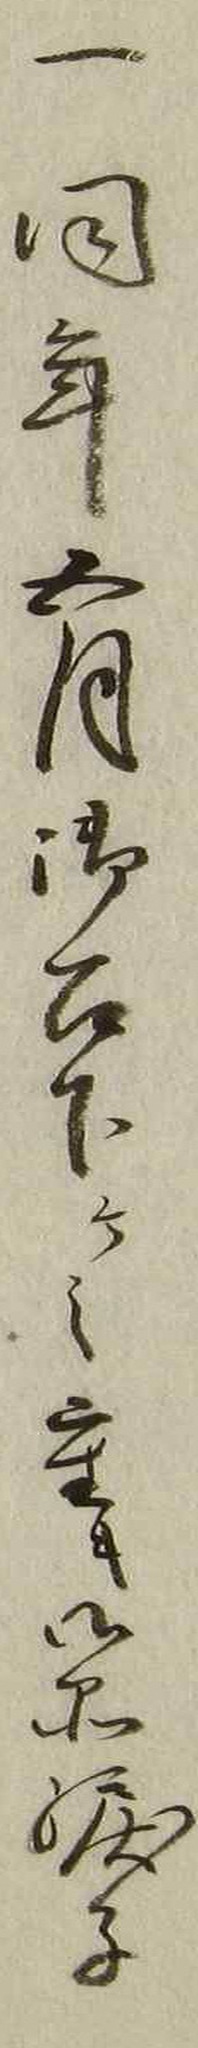一同年五月御召下ケ之重キ御品綟子
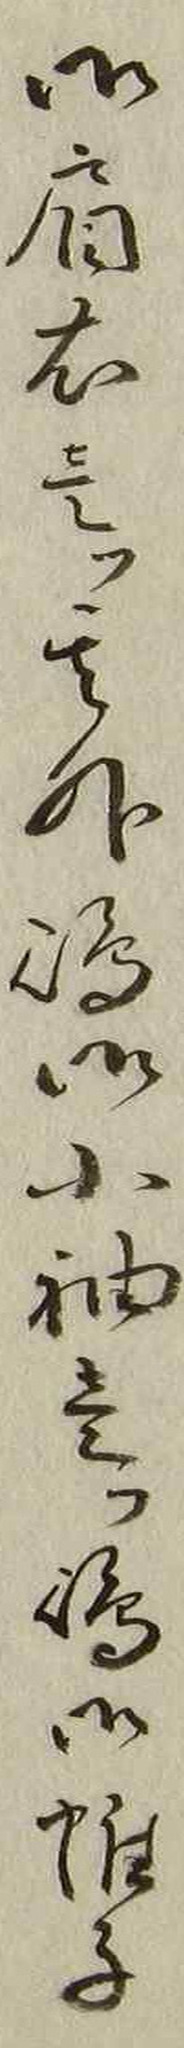御肩衣壱ツ其外嶋御小袖壱ツ嶋御帷子
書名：諸士系譜　巻之4　い之部4
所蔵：会津若松市立会津図書館
